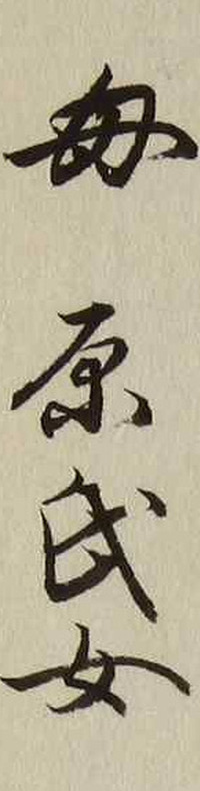母原氏女
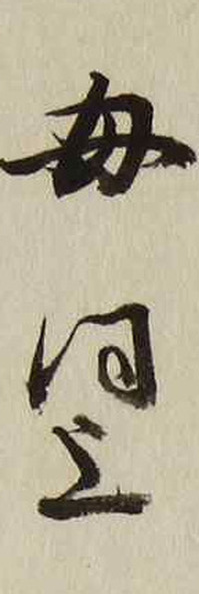母同上
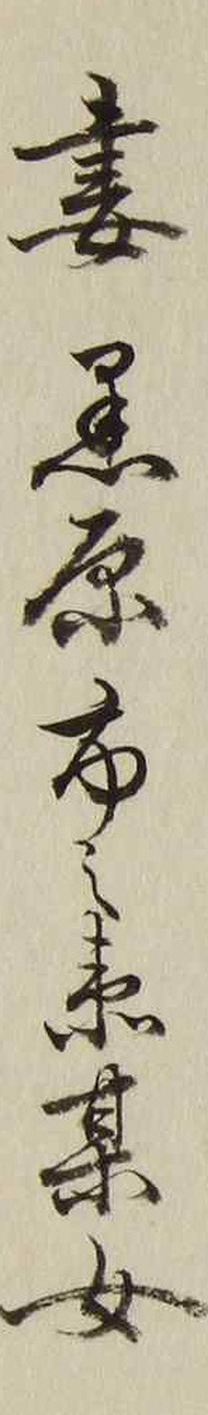妻黒原市之衛某女

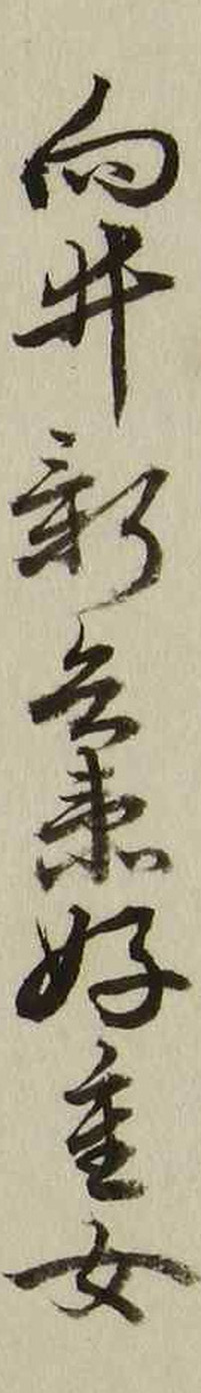向井新兵衛好重女
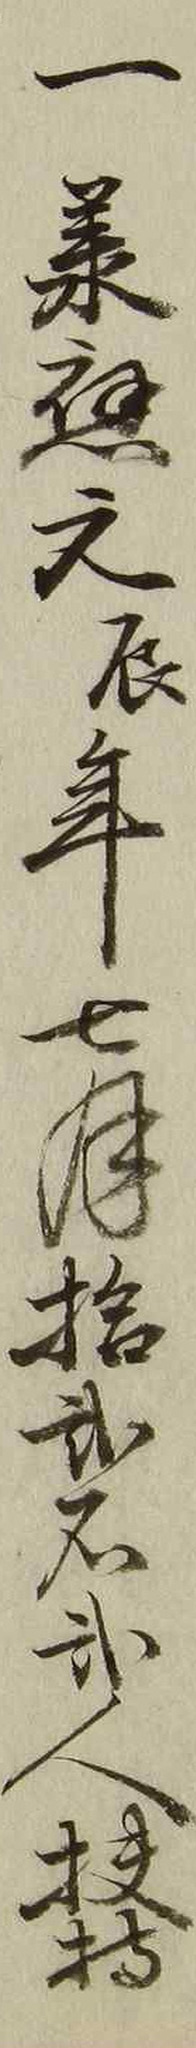一承応元辰年七月拾弐石弐人扶持
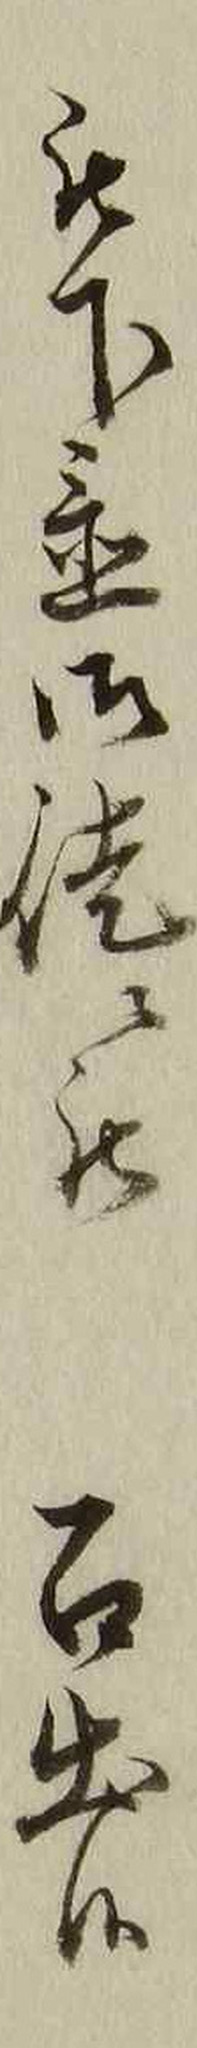被下置御徒ニ被召出候
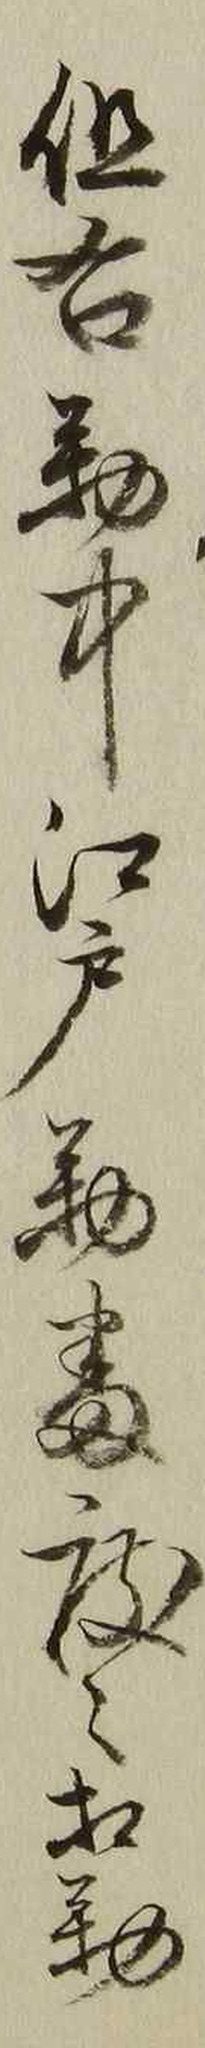但右勤中江戸勤番度々相勤
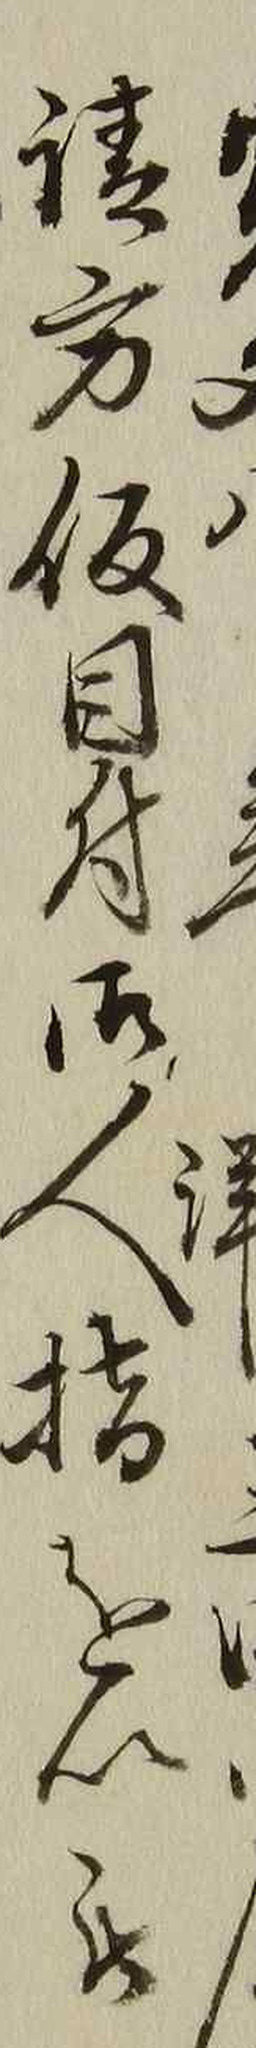請方仮目付御人指を以被
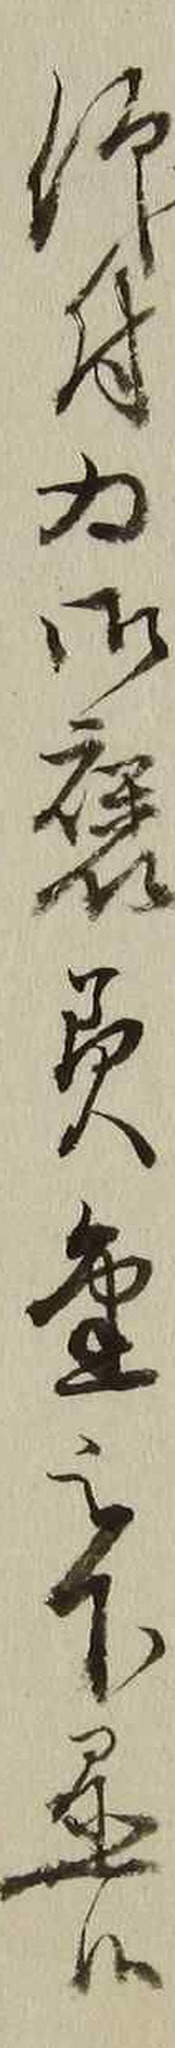仰付為御褒美金被下置候
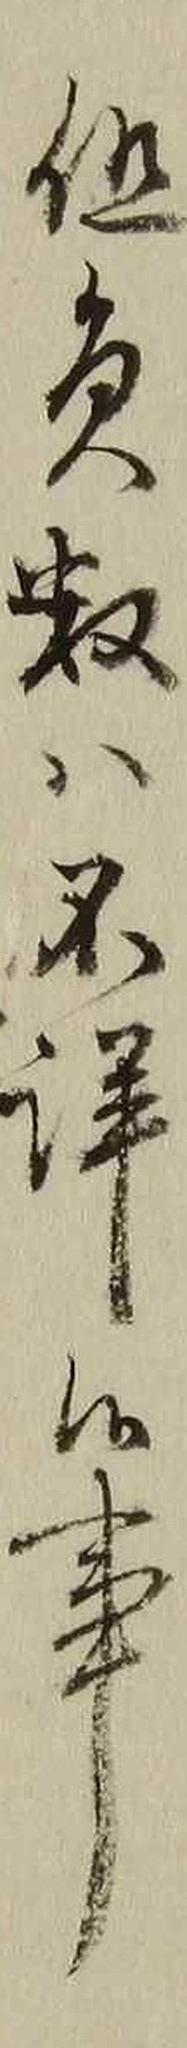但員数ハ不詳候事
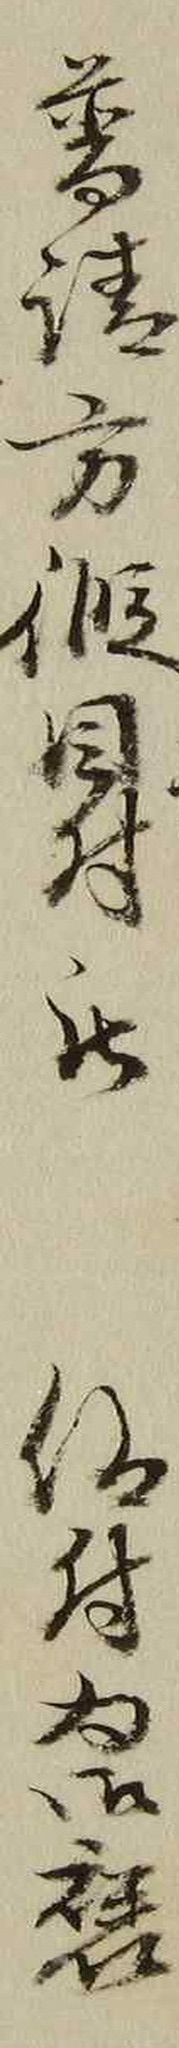普請方仮目付被仰付為御褒
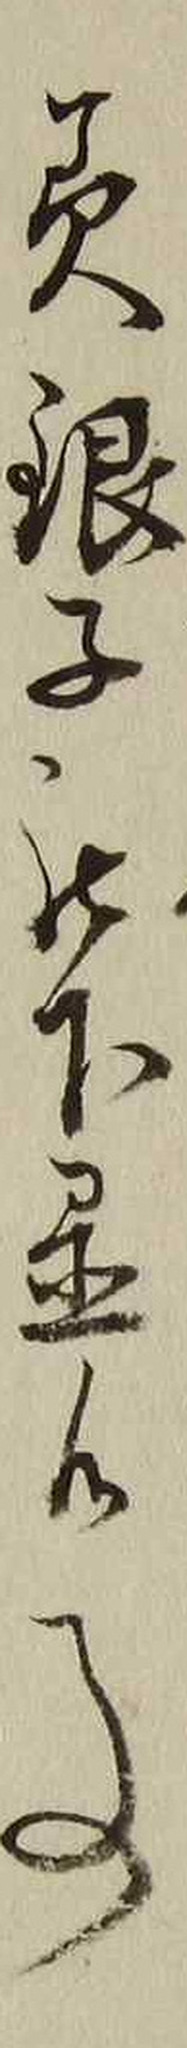美銀子被下置候事
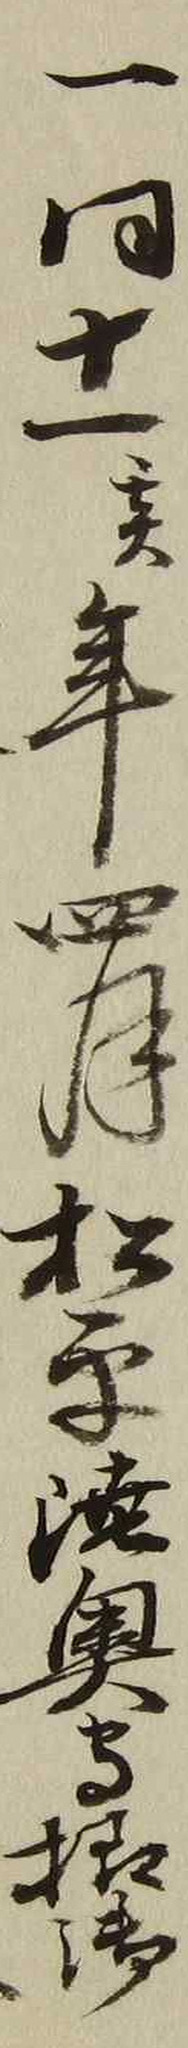一同十一亥年四月松平陸奥守様御
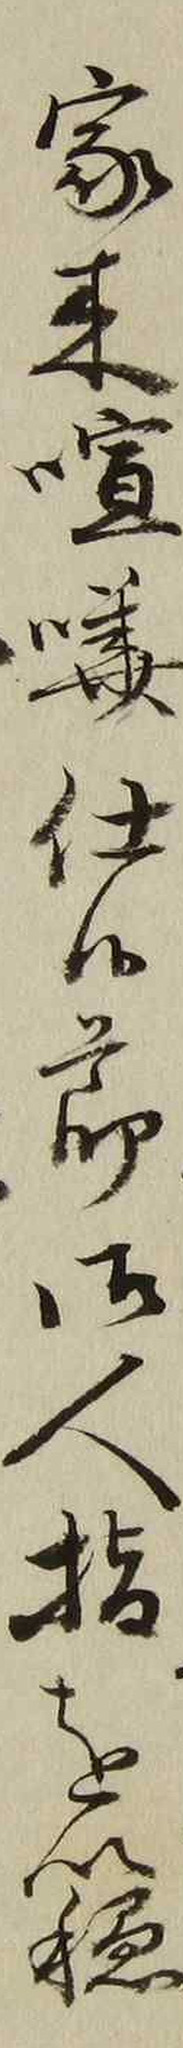家来喧嘩仕候節御人指を以穏
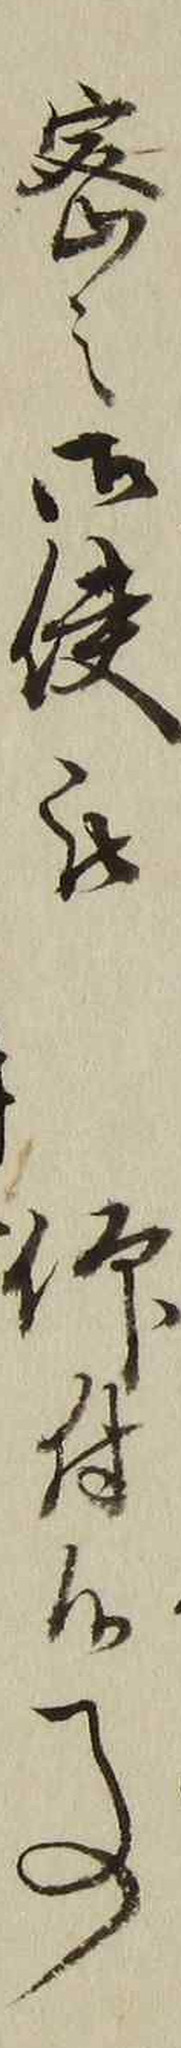密之御使被仰付候事
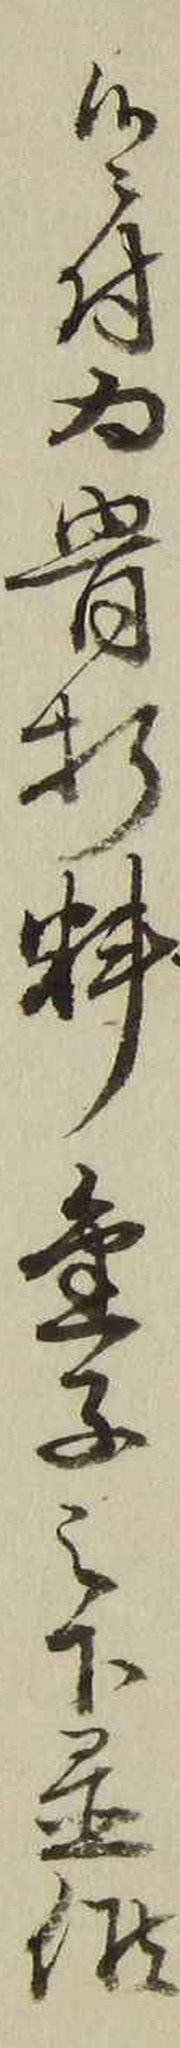候ニ付為骨折料金子被下置候
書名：諸士系譜　巻之36　は之部4
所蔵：会津若松市立会津図書館
